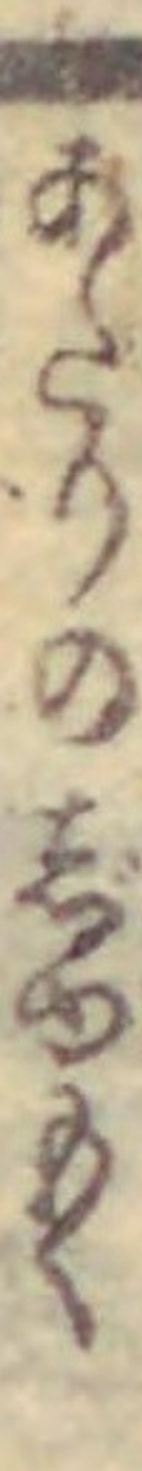あたりのじゆもく
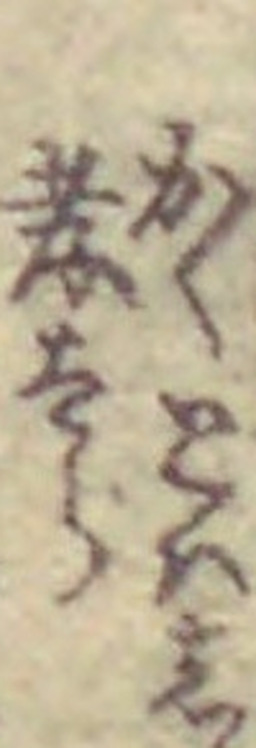孝太郎
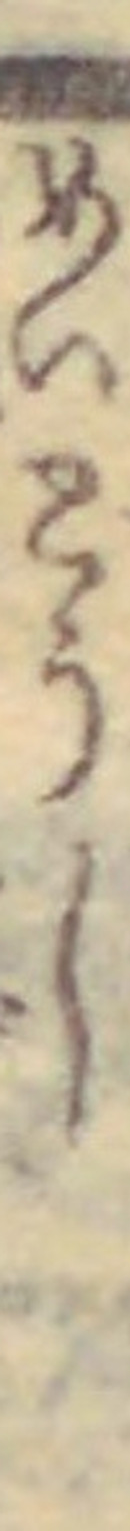めいどうし
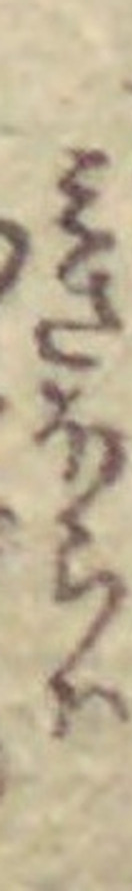みさほらは
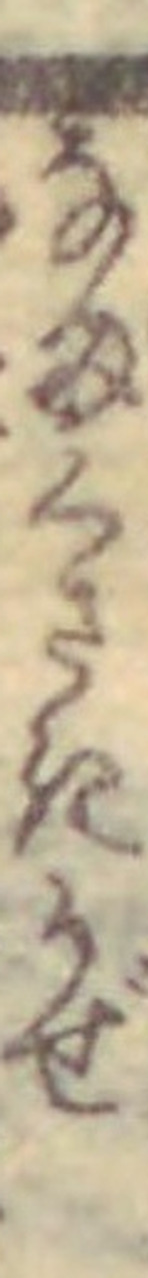なまくさきかぜ
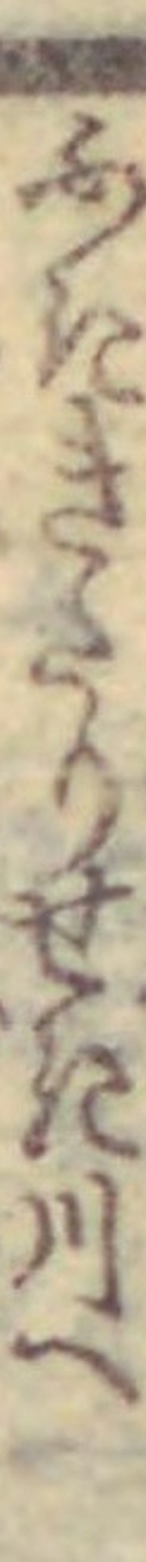ふききたりせき川へ
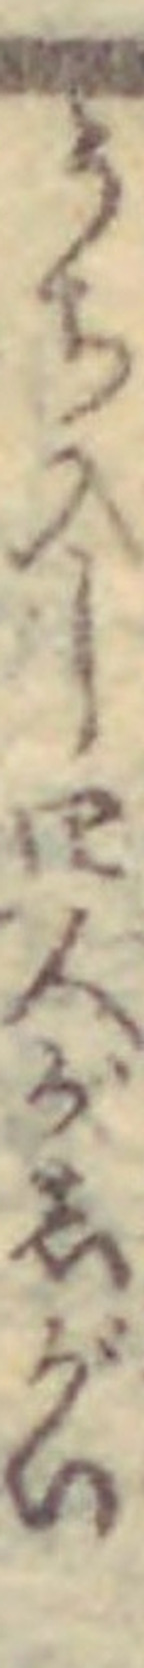うち入し四人がしがい
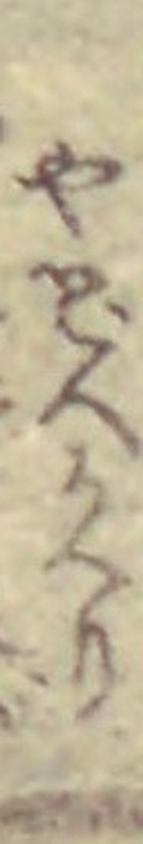やどへかへり
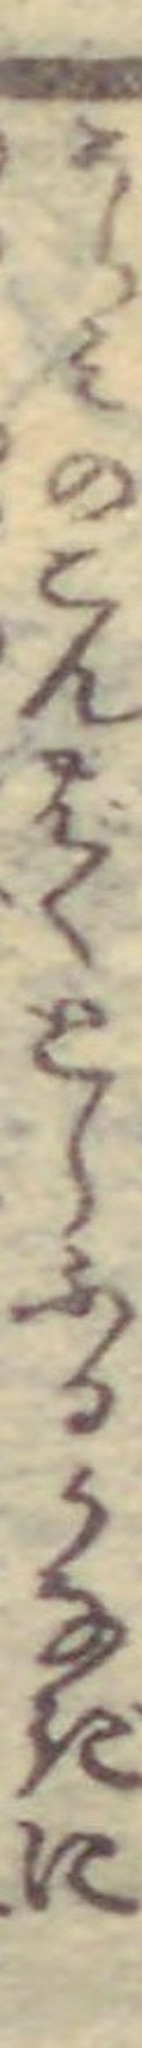うらみのこんばくとしふるうなぎに
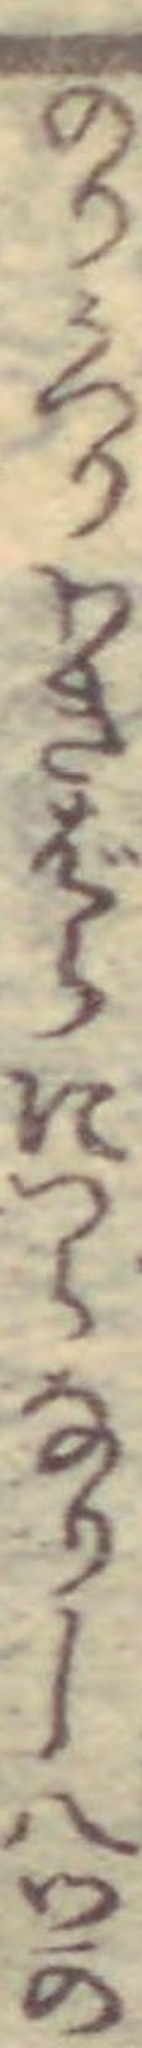のりうつりわきばらにつらなりし八ッか
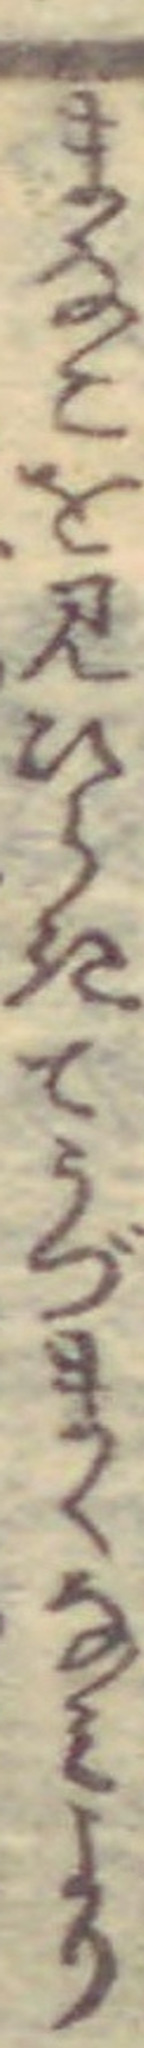まなこを見ひらきてうづまくなみより
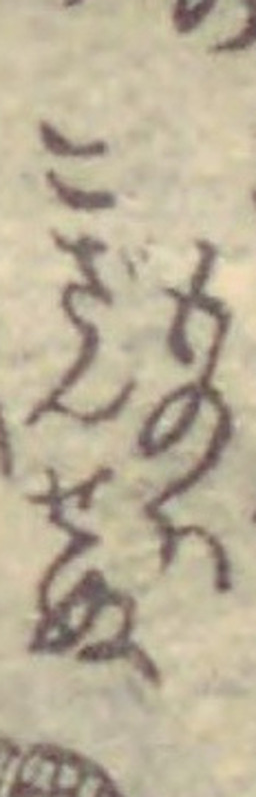こざんせぬ
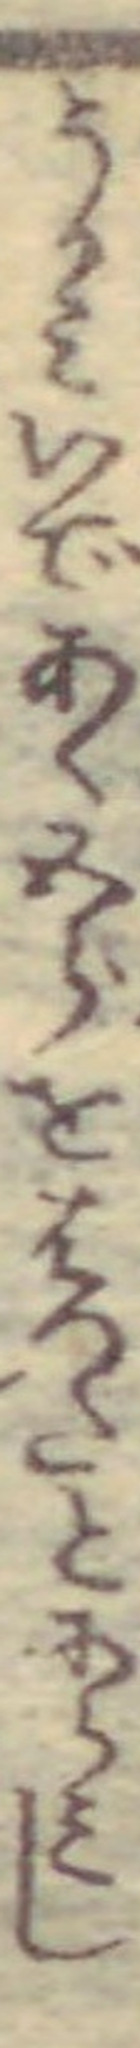うかみいであく五郎をはつたとにらみし
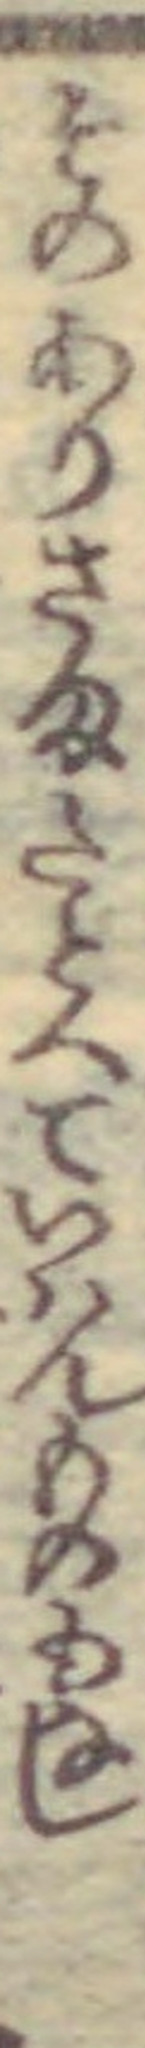そのありさまたとへていはんものもなし
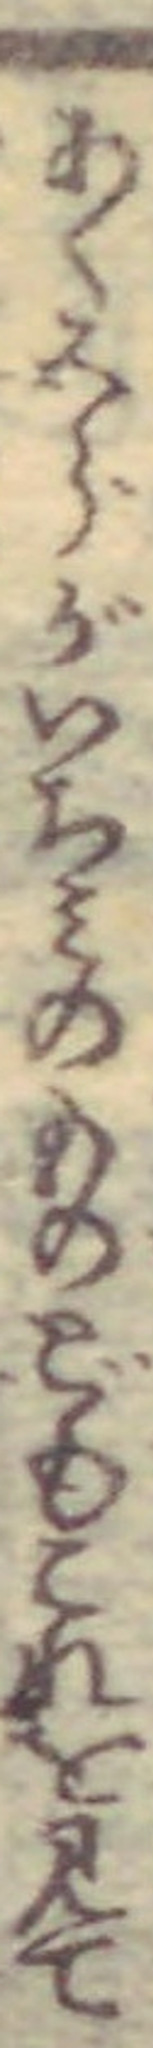あく五郎がいちみのものどもこれを見て
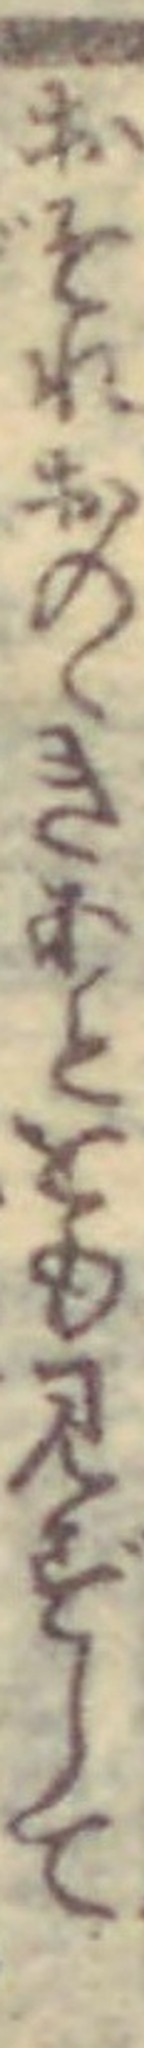おそれおのゝきあとをも見ずして
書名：八ツ目鱣因縁物語 3巻
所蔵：国立国会図書館 National Diet Library, JAPAN
